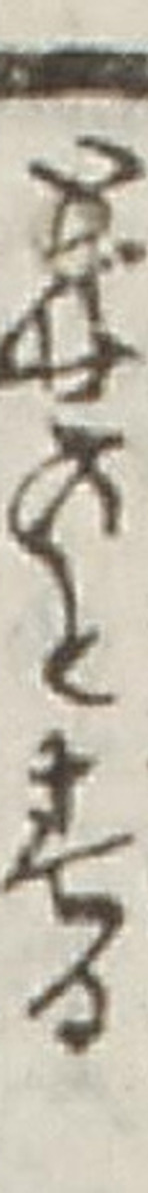とせいとする
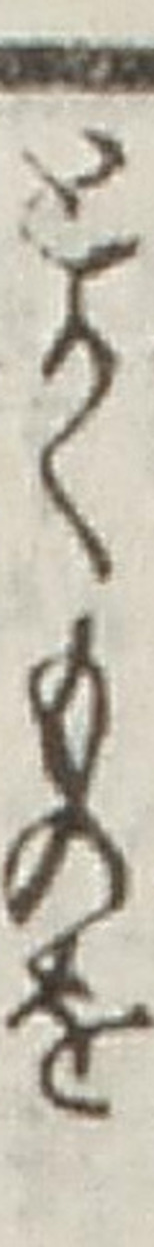とかくものを
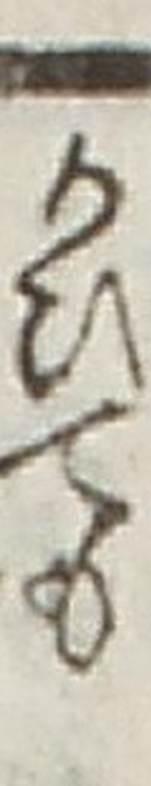かひても
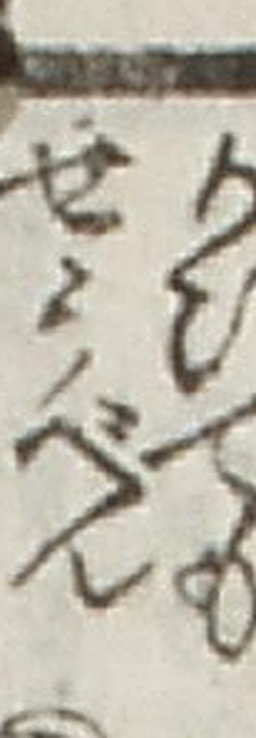せうべん
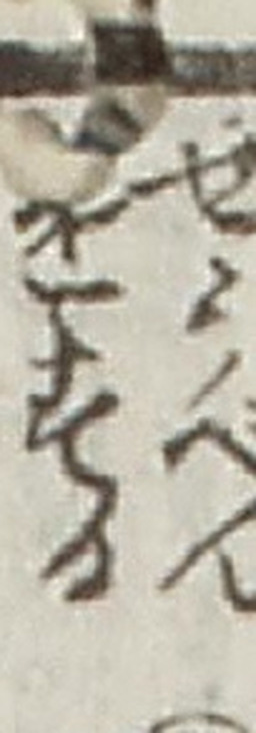をする
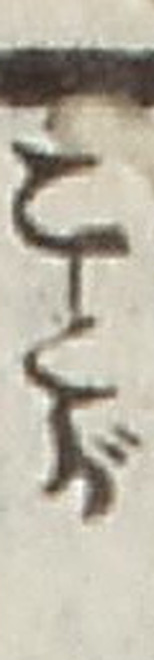ことが
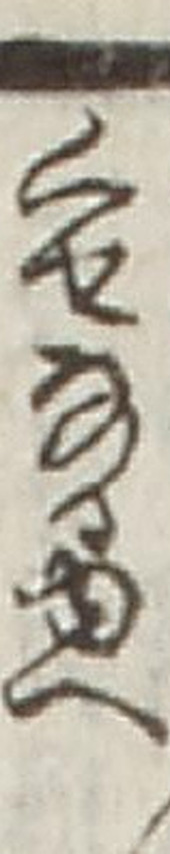くせなるゆへ
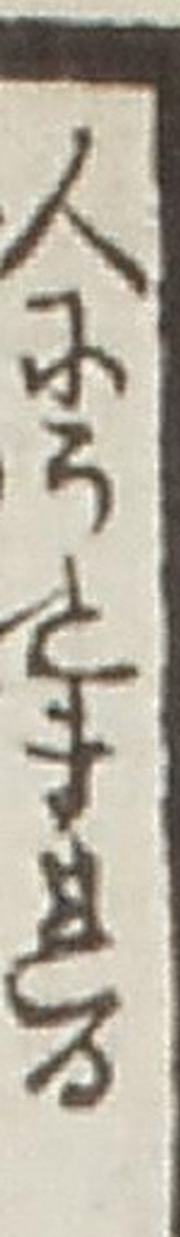人にうとまれる
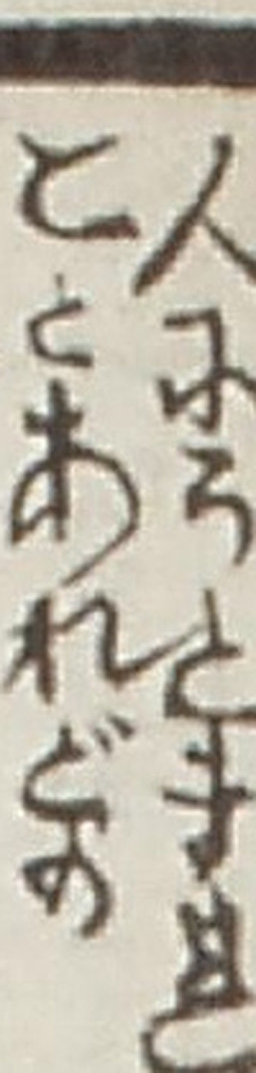ことあれども
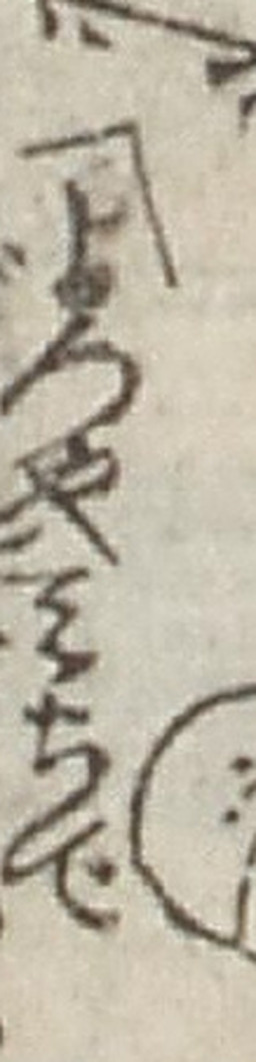〽よつやみちで
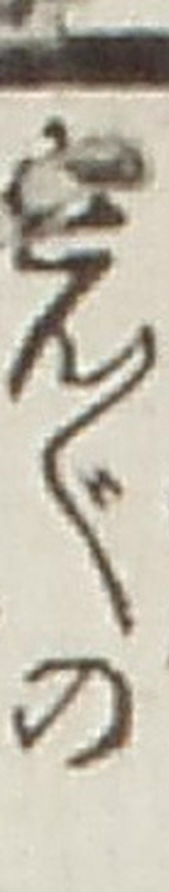きん〴〵の
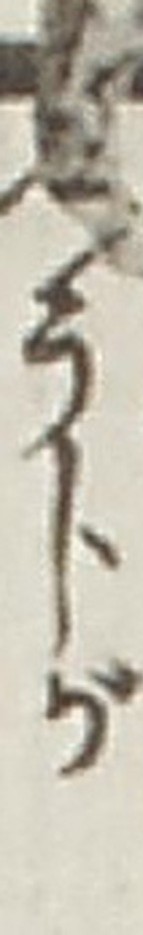つうじが
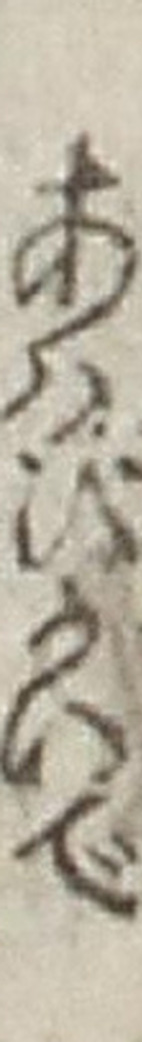あは？びかいで
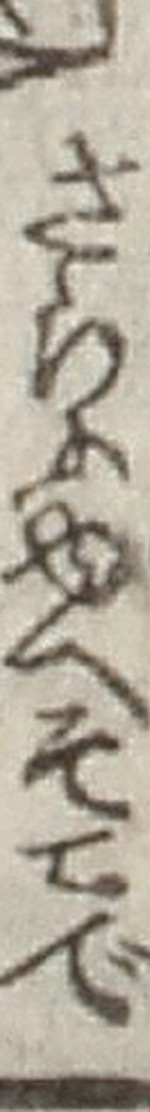さらふゆへそこで
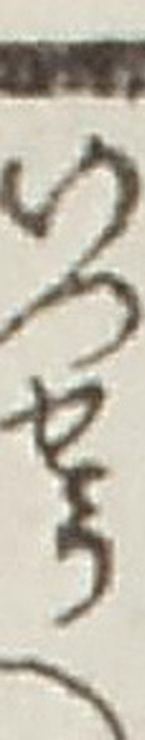いつせう
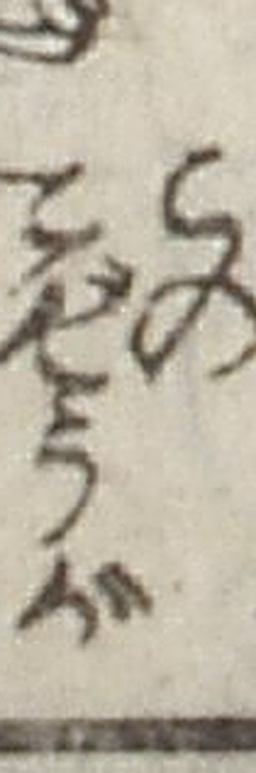こぞうが
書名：三世相出雲當座帳　上下冊
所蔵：東京大学地震研究所図書室 Earthquake Research Institute Library, The University of Tokyo, JAPAN
